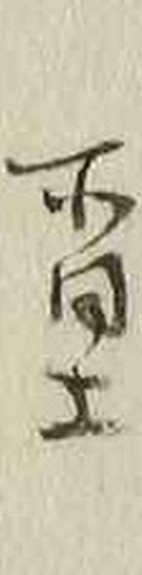所同上
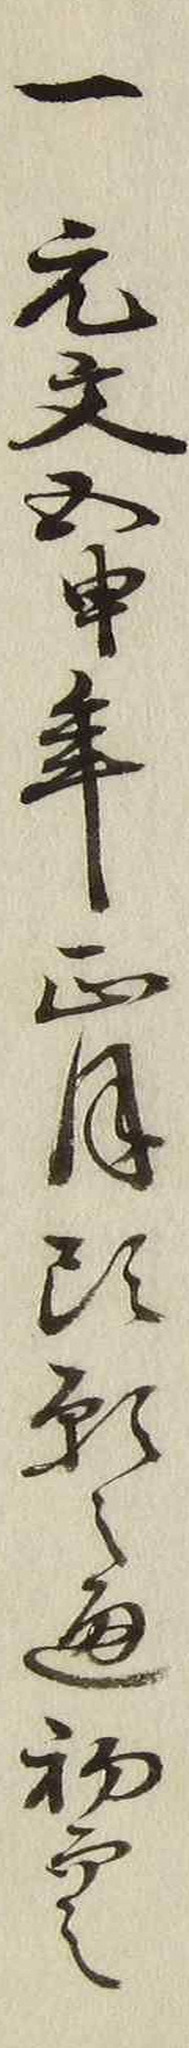一元文五申年正月頭願之通初而之
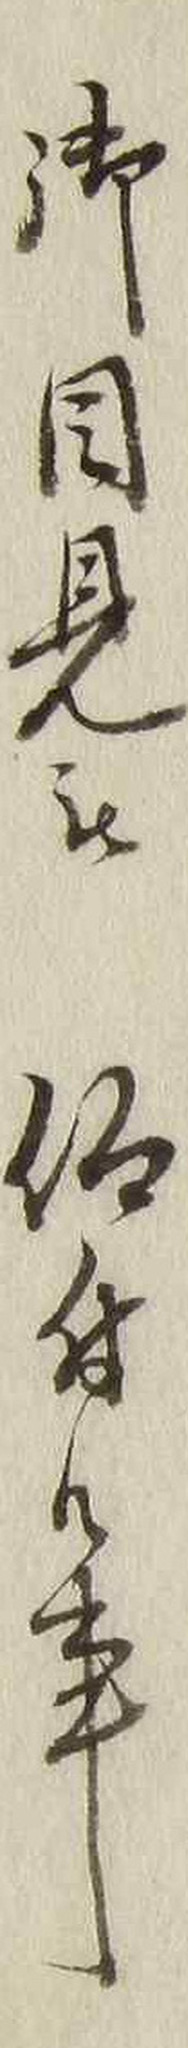御目見被仰付候事
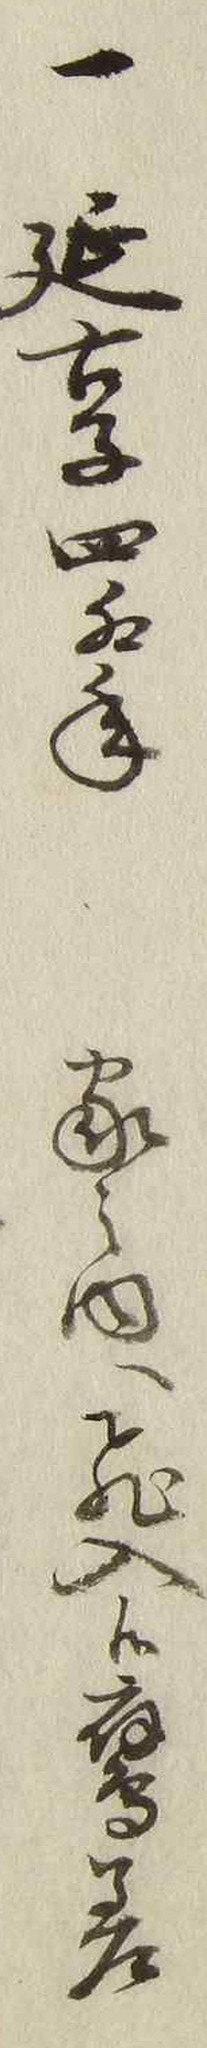一延享四卯年家之内へ飛入候鷹差
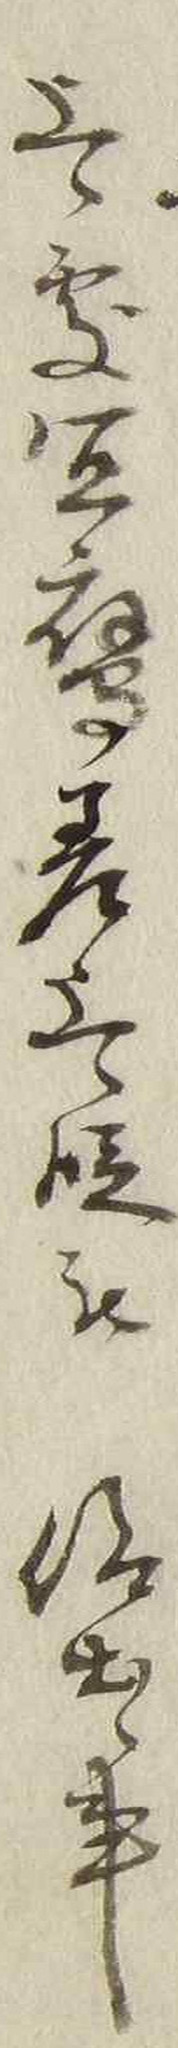上候処宜鷹差上候段被仰出候事
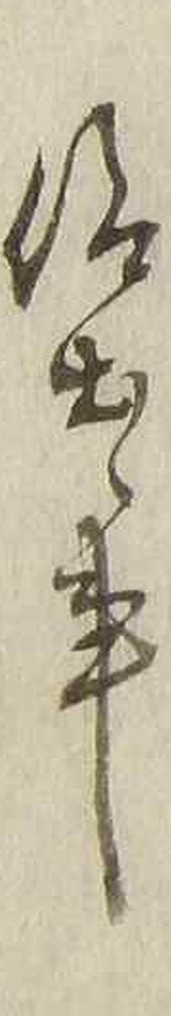仰付候事
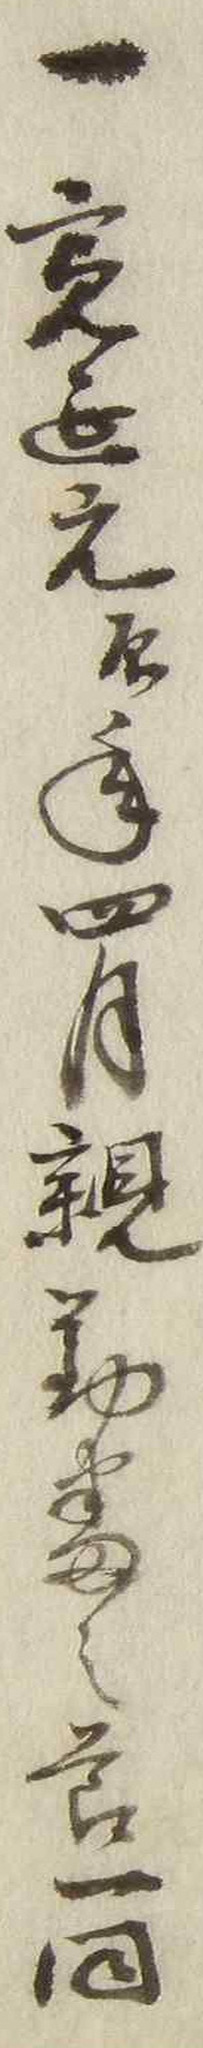一寛延元辰年四月親勤番之節一同

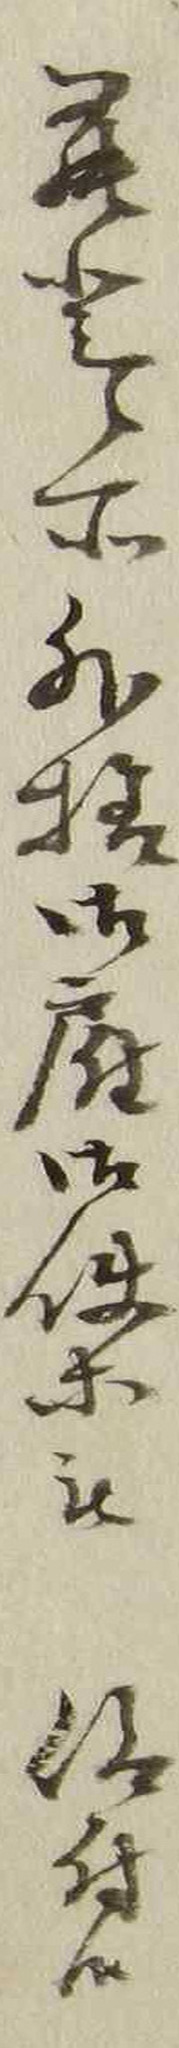罷登候所外様御雇御使等被仰付候
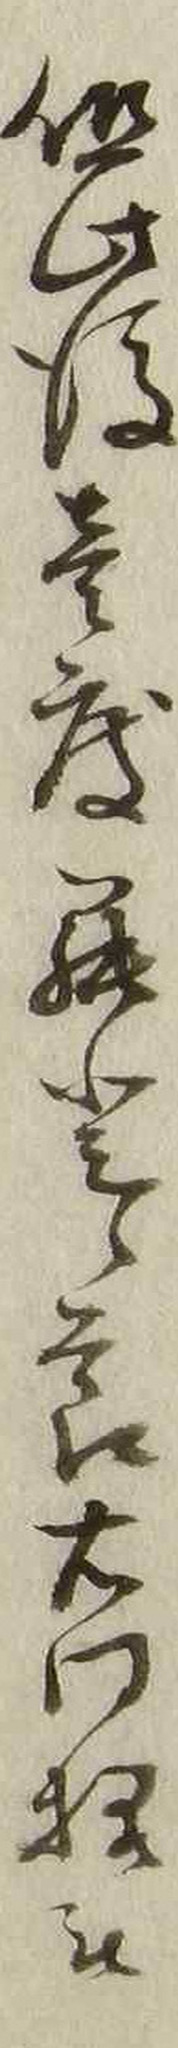但此後壱度罷登候節右同様被
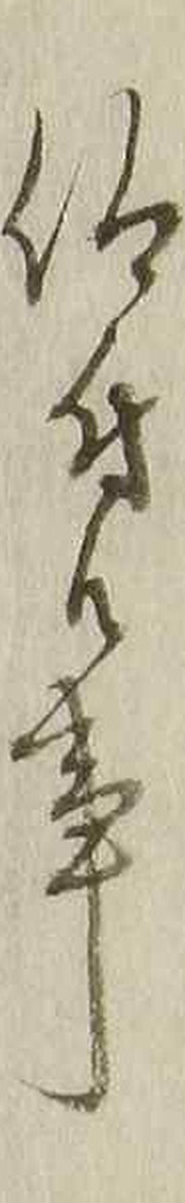仰付候事
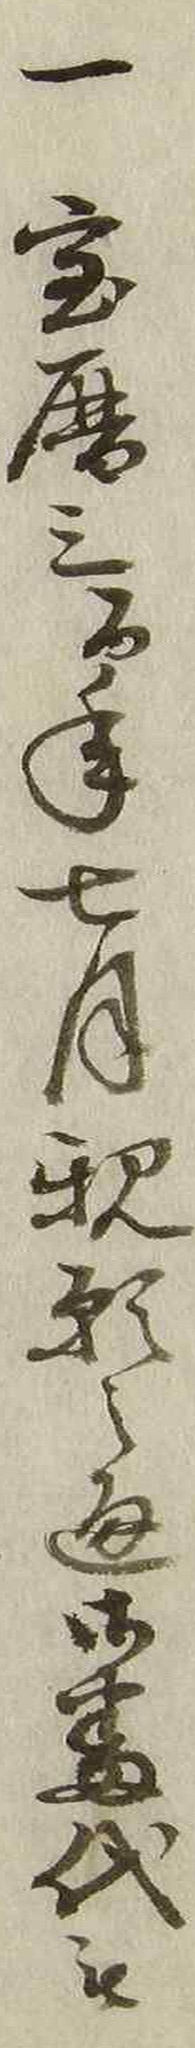一宝暦三酉年七月親願之通御番代被
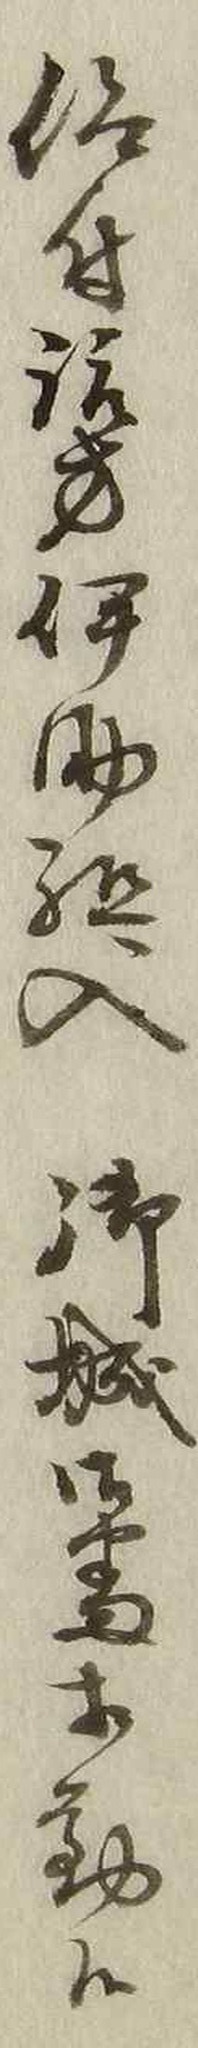仰付諏方伊助組へ入御城御番相勤候
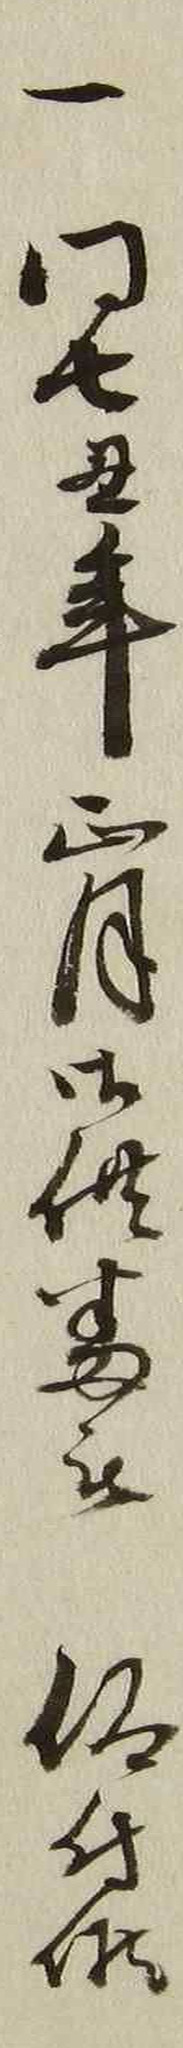一同七丑年正月御供番被仰付候
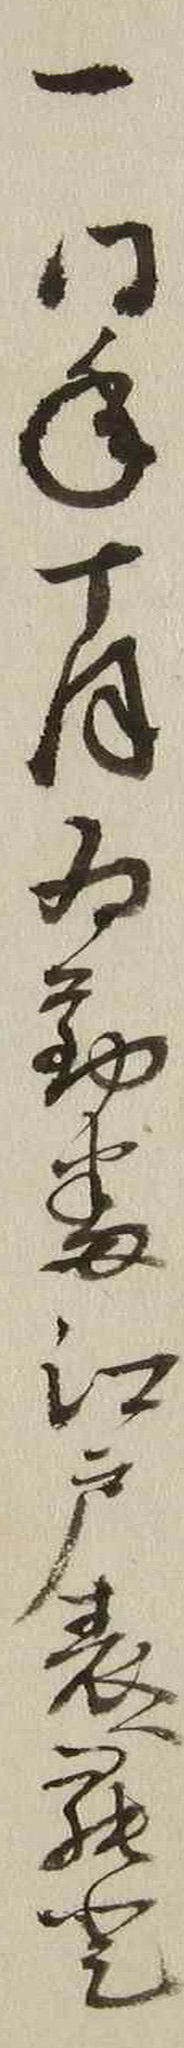一同年十月為勤番江戸表へ罷登
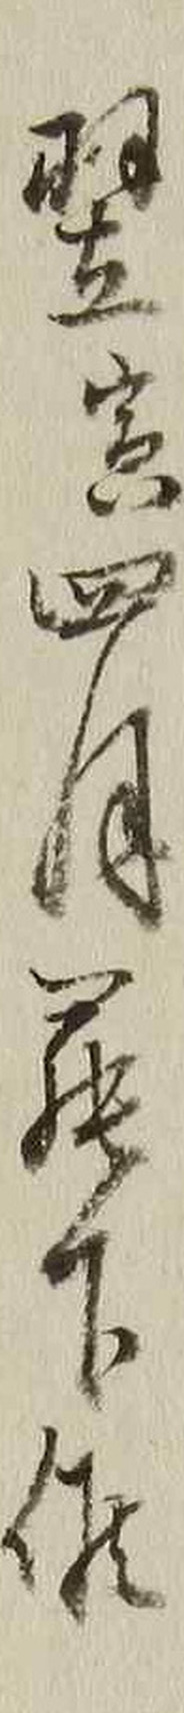翌寅四月罷下候
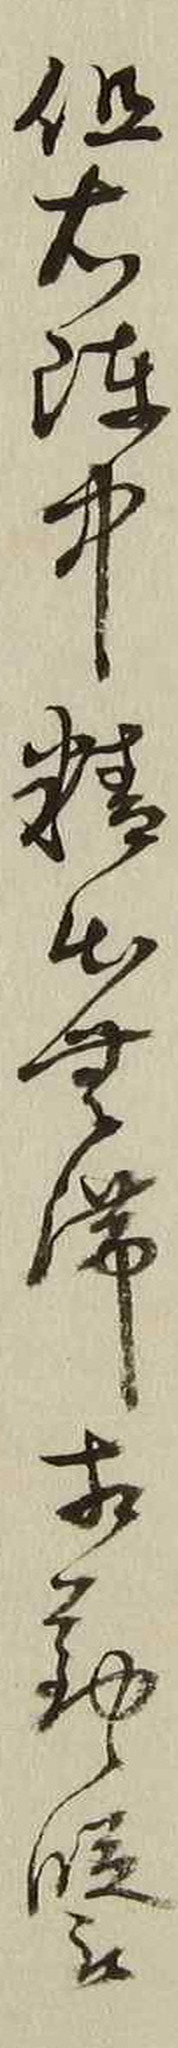但右陣中精出無滞相勤候段被
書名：諸士系譜　巻之27　い之部27
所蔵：会津若松市立会津図書館
